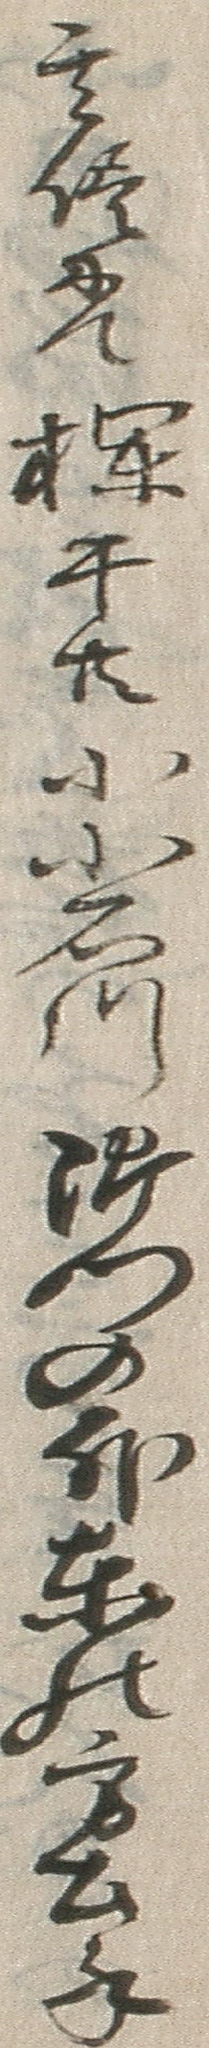其儘にて欄干共に小石川御門の外東の方土手
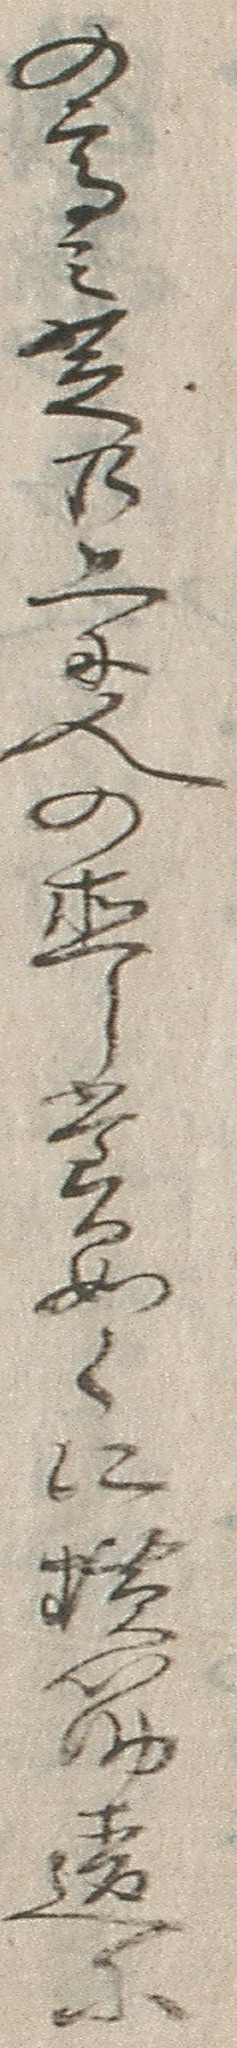の高み芝の上に人の直したる如くに横筋違に
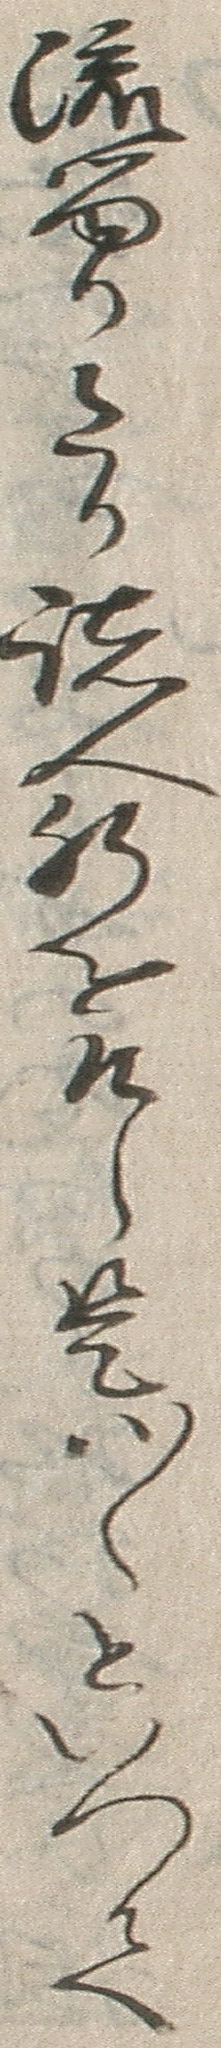流留りたり諸人行をけし是は〳〵といつて
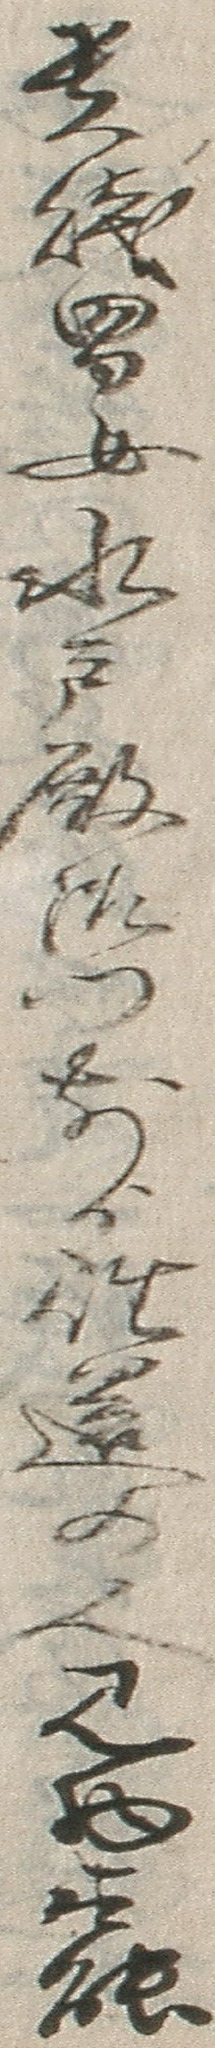貴賤男女水戸殿御門前ゟ往還の人見ゆる能
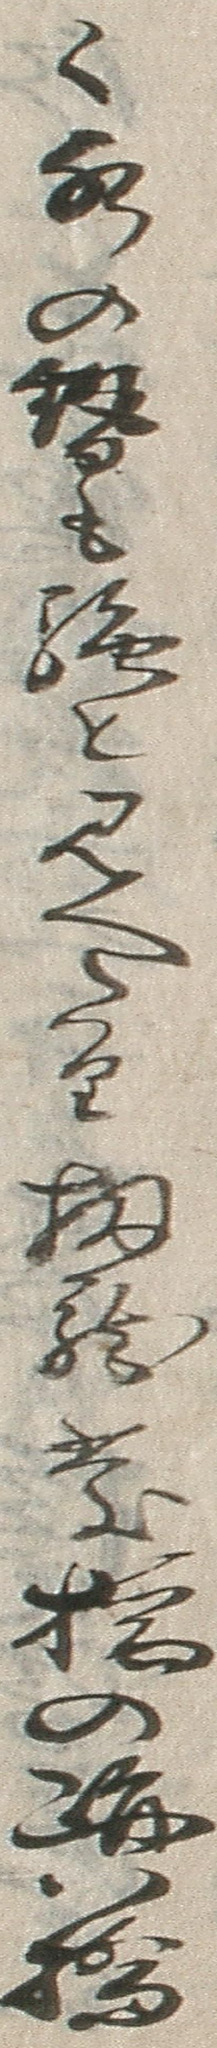く水の勢も強と見へたり扨龍慶橋の跡は橋
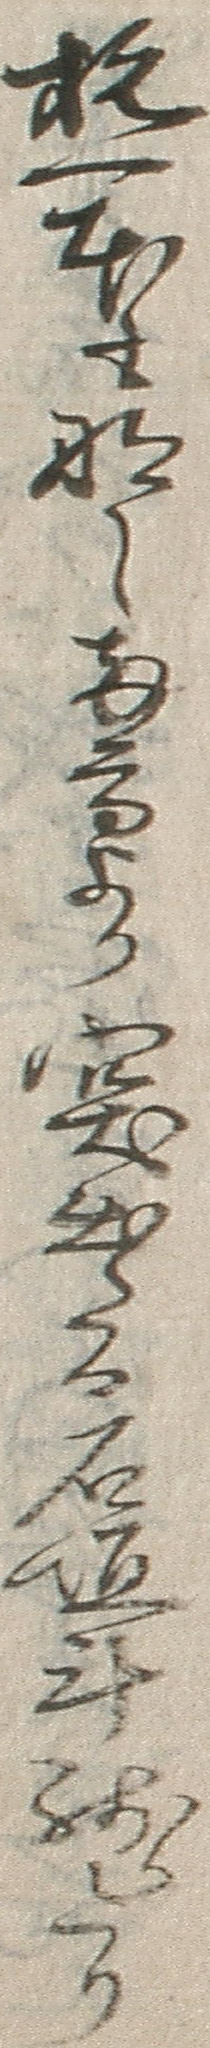杭一本もなし両方より突出たる石垣斗残りたり

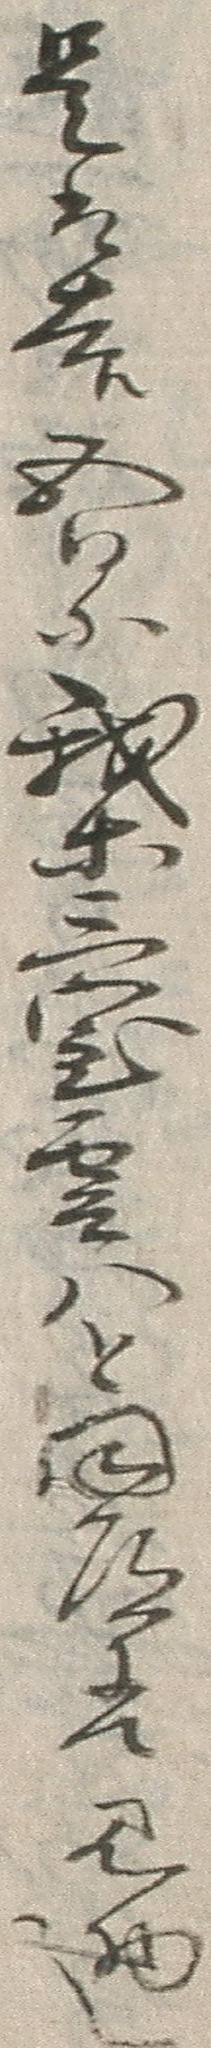是は去ル五日に我等三室雲八と同道にて見物し
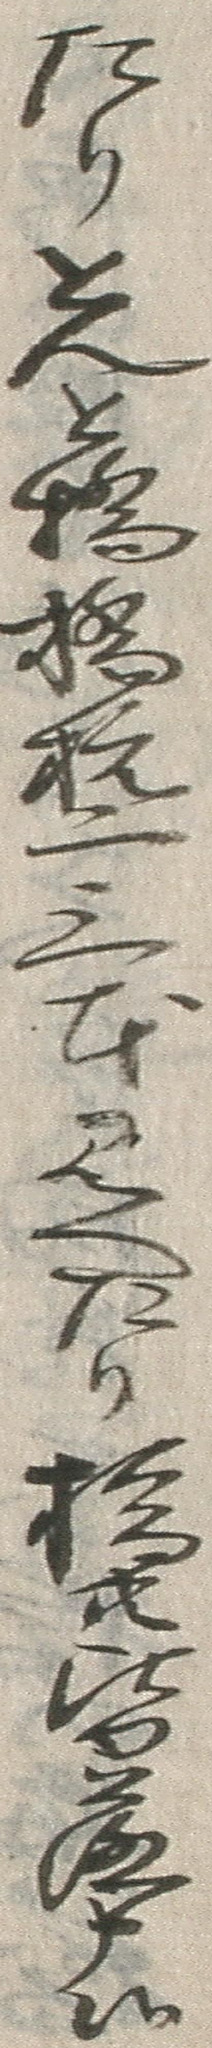たりとんと橋橋杭二三本見へたり橋共皆落申候
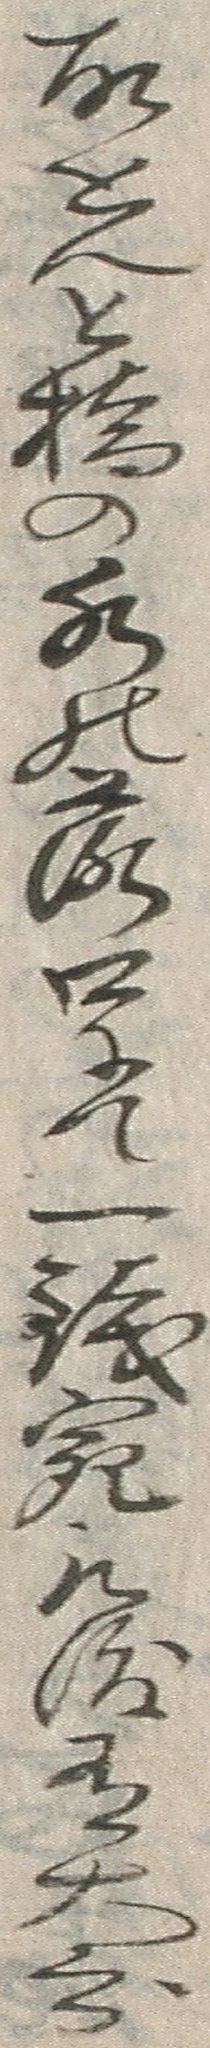故とんと橋の水の落口にて一銭宛取渡有大分
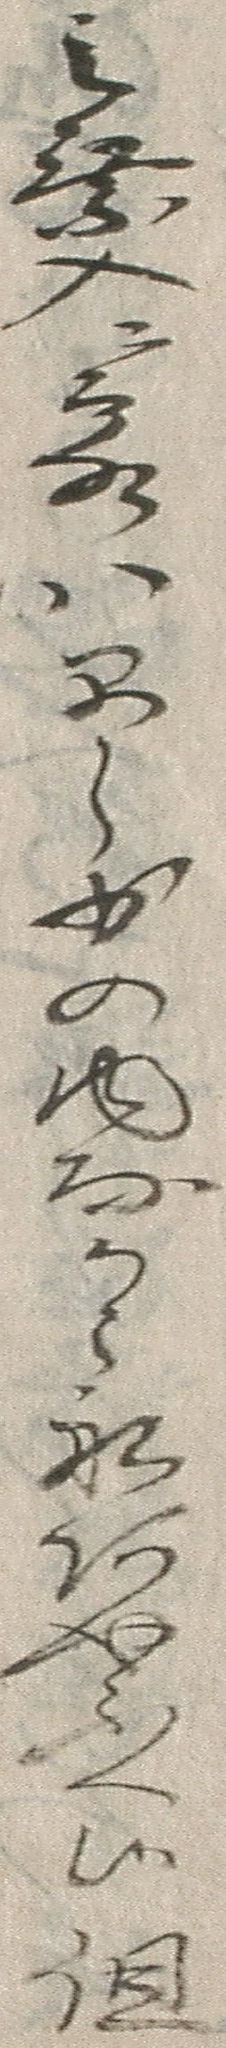之乗入にて水は早し少の内なから船あやふく候但
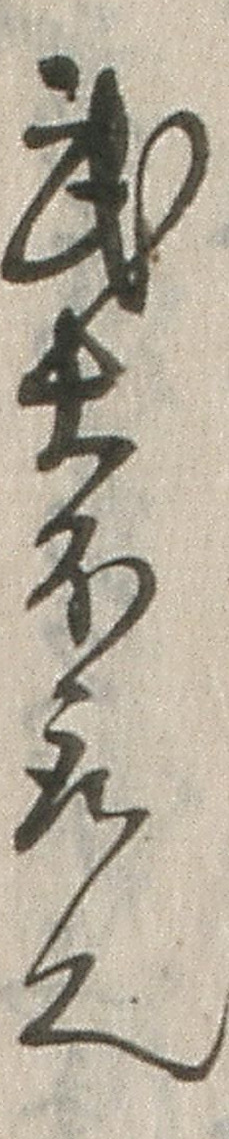武士不取也
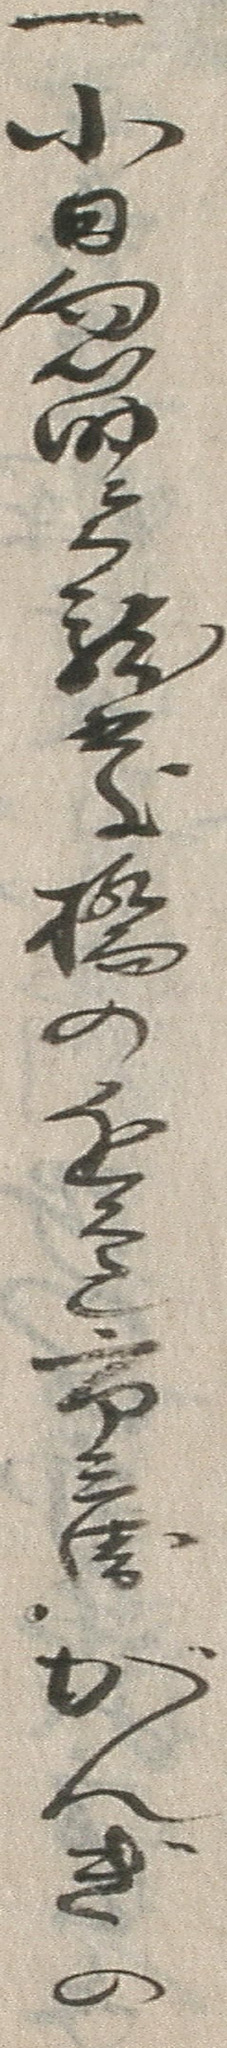一小日向筋にて龍慶橋の近辺市兵衛がんぎの
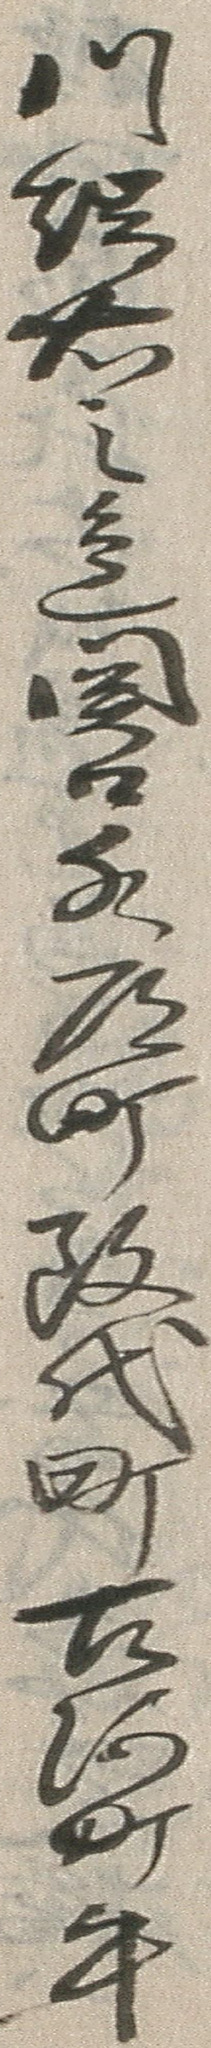川端右の辺関口水道町改代町古河町牛
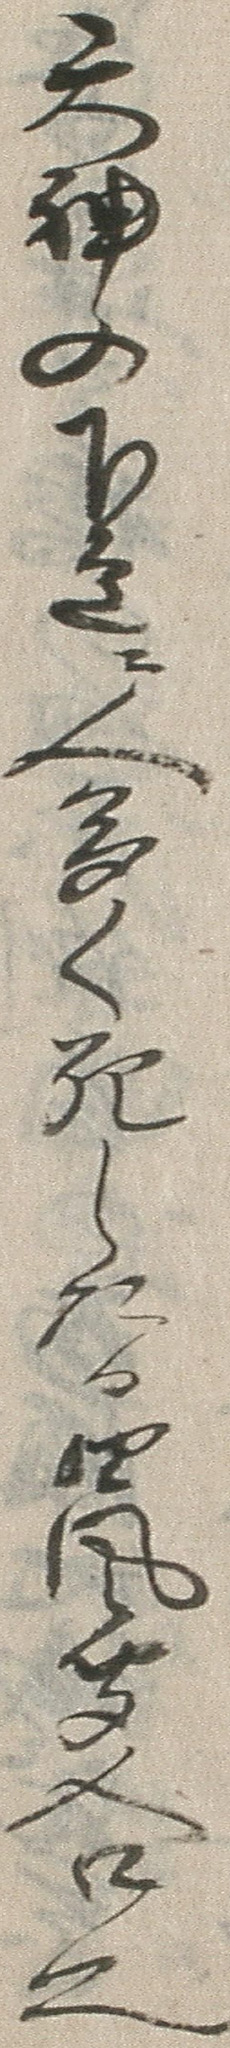天神の下辺に人多く死したる由風聞人口也
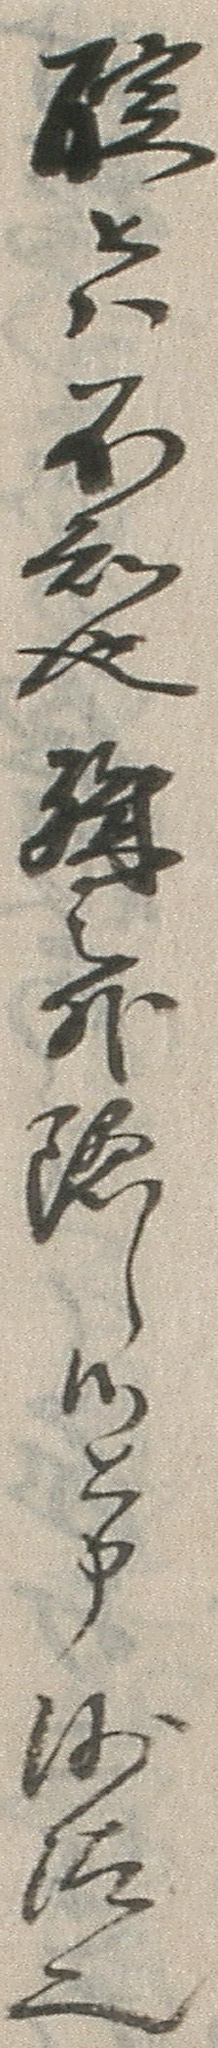聢とは不知也殊之外隠し候と申沙汰也
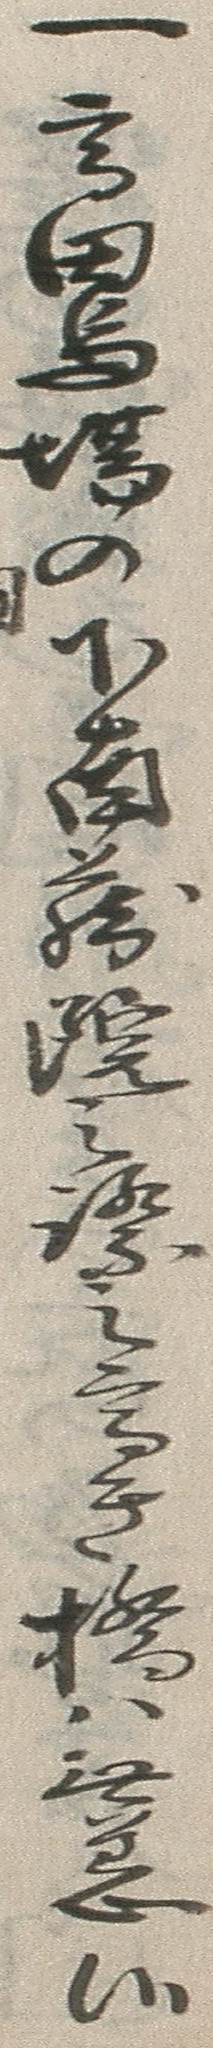一高田馬場の下南蔵院の際の高き橋は無恙候
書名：享保十三年江戸洪水記
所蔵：東京大学地震研究所図書室 Earthquake Research Institute Library, The University of Tokyo, JAPAN
